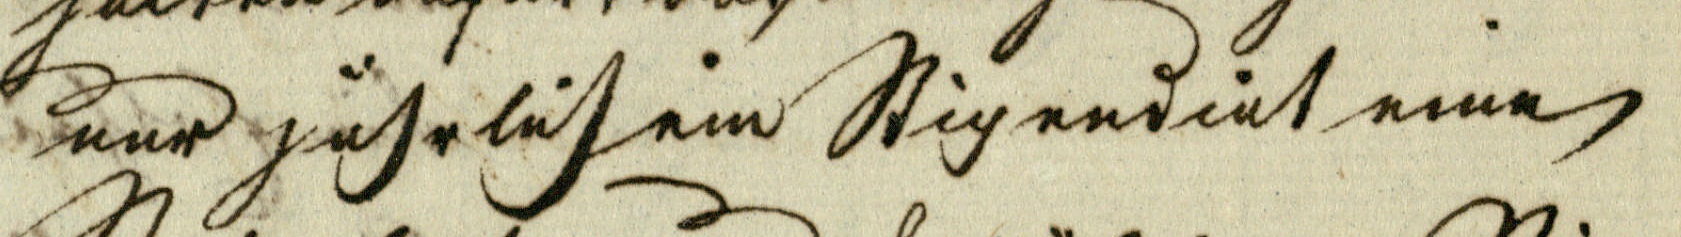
nur jährlich ein Stipendiat eine
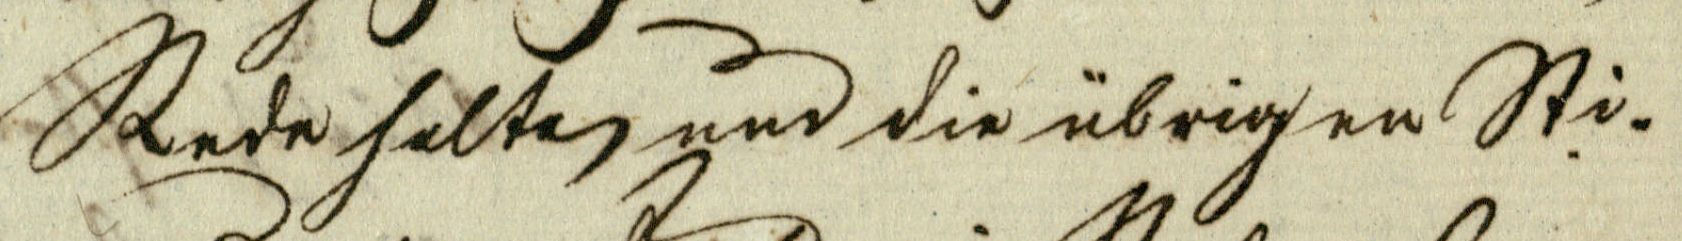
Rede halte und die übrigen Sti¬
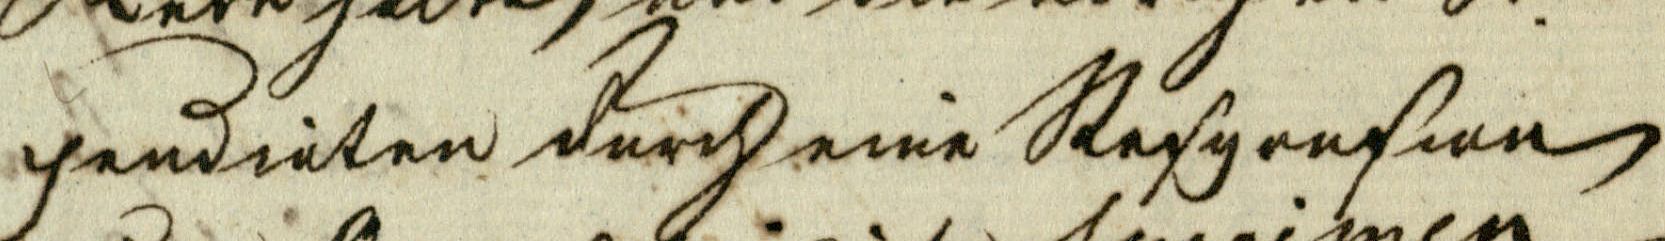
pendiaten durch eine Responsion,
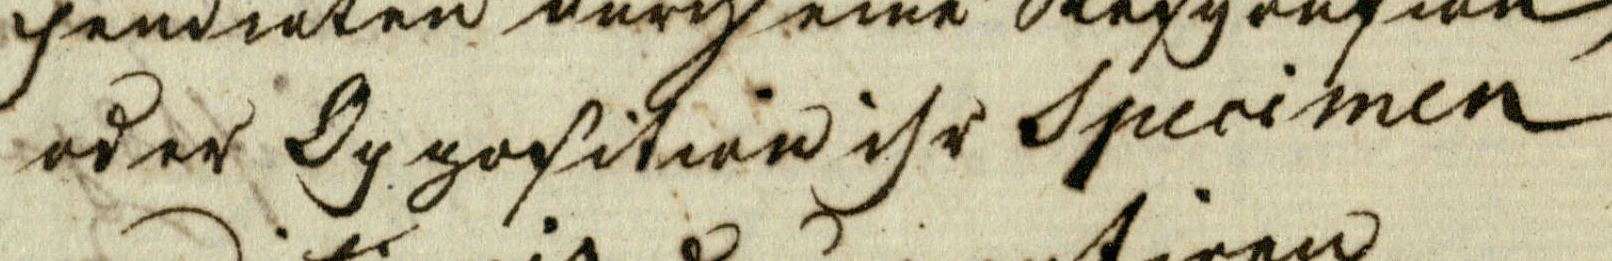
oder Opposition ihr Specimen
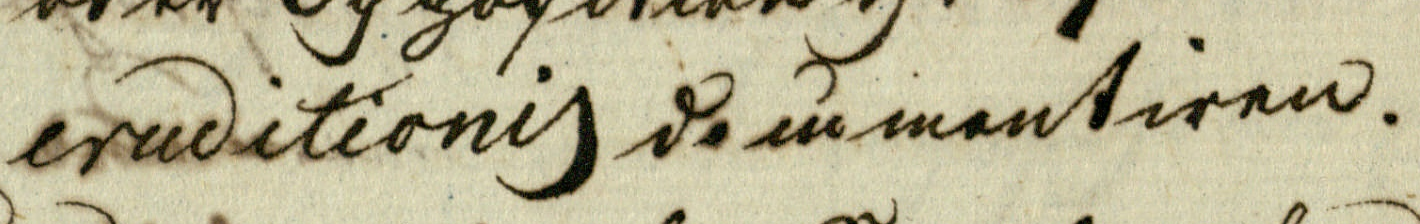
eruditionis documentiren.
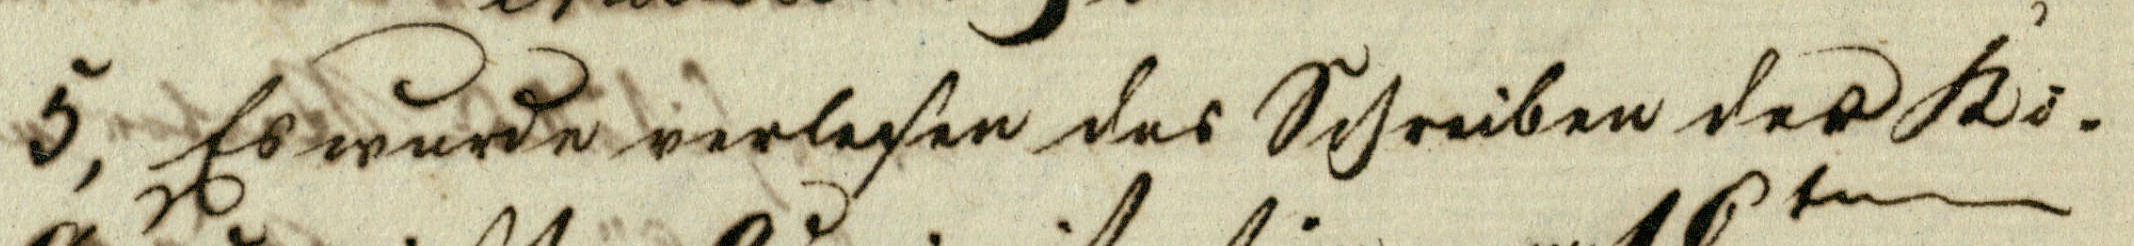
5, Es wurde verlesen das Schreiben der Kö¬
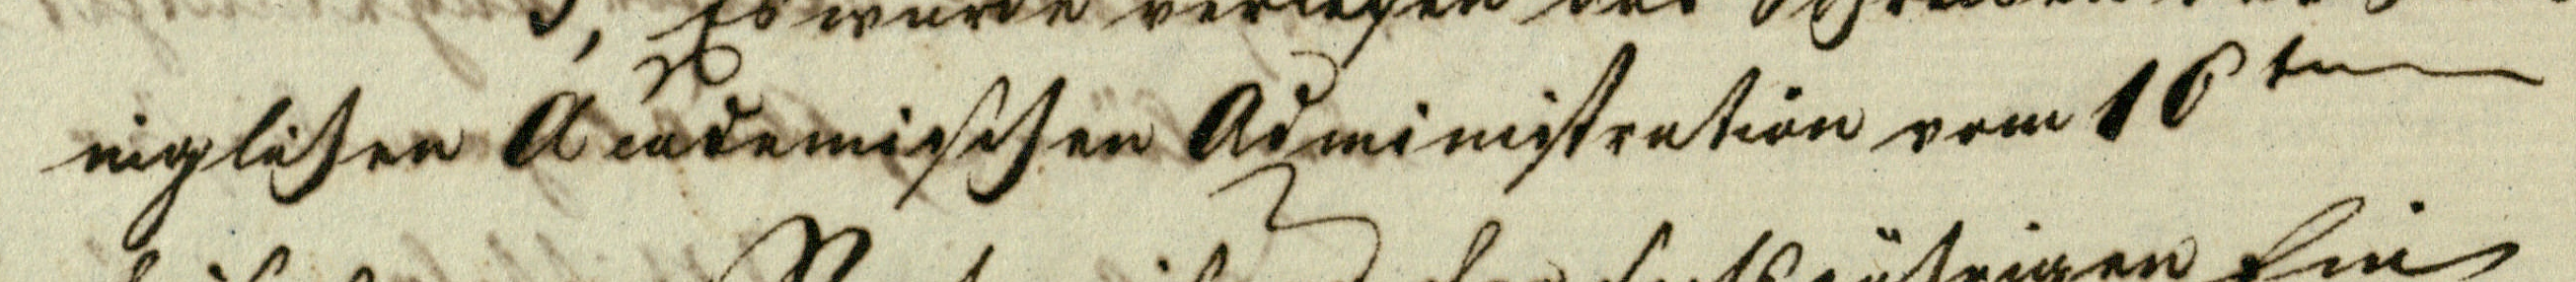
niglichen Academischen Administration vom 16 ten
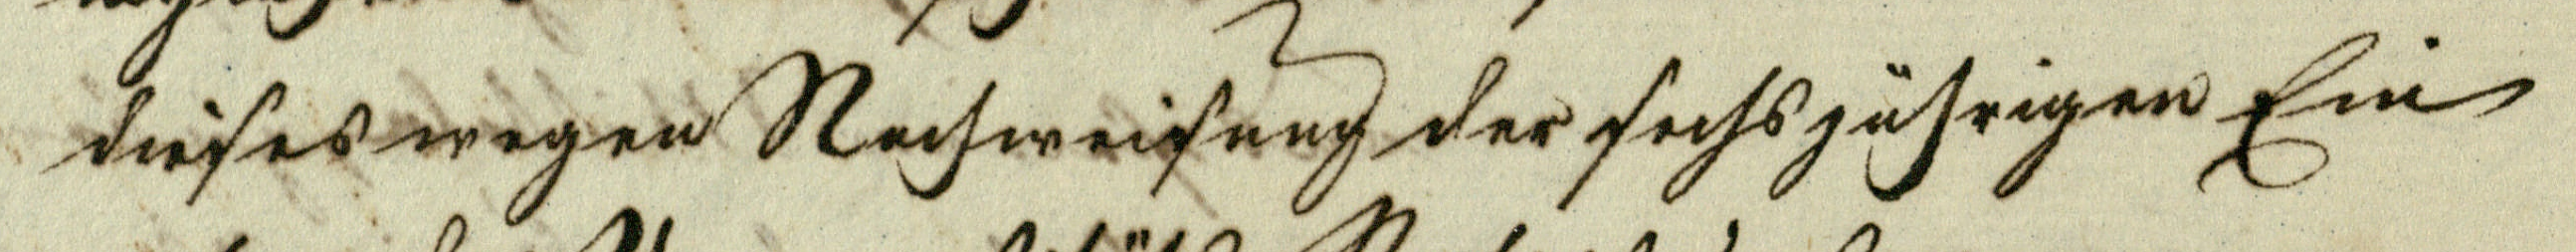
dieses wegen Nachweisung der sechsjährigen Ein¬
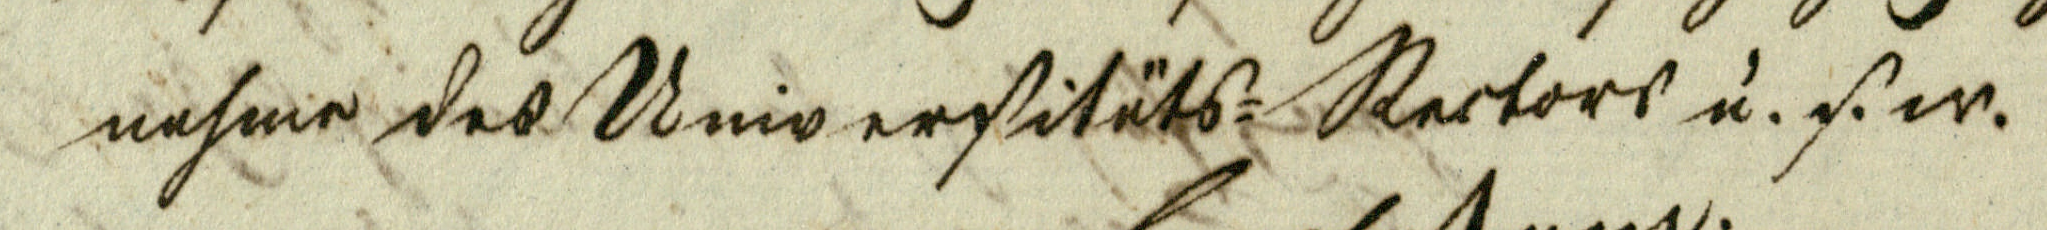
nahme des Universitäts-Rectors u. s. w.
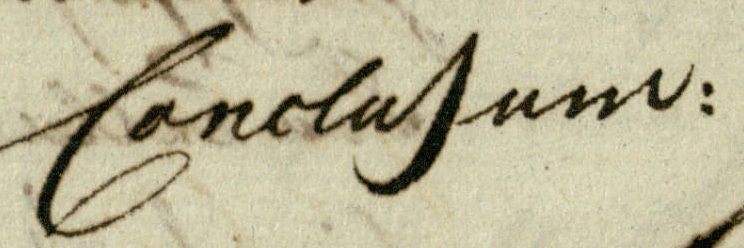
Conclusum:
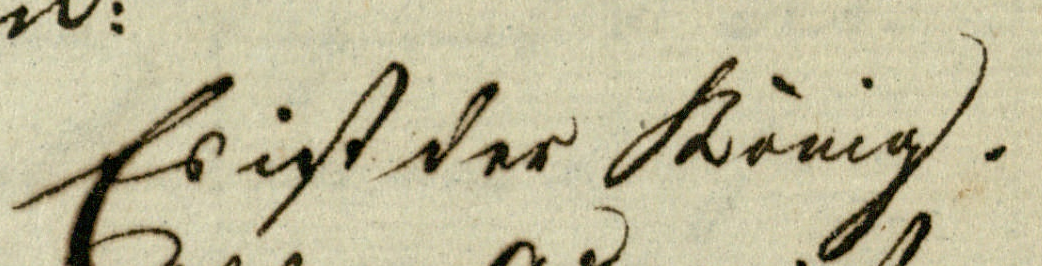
Es ist der König¬
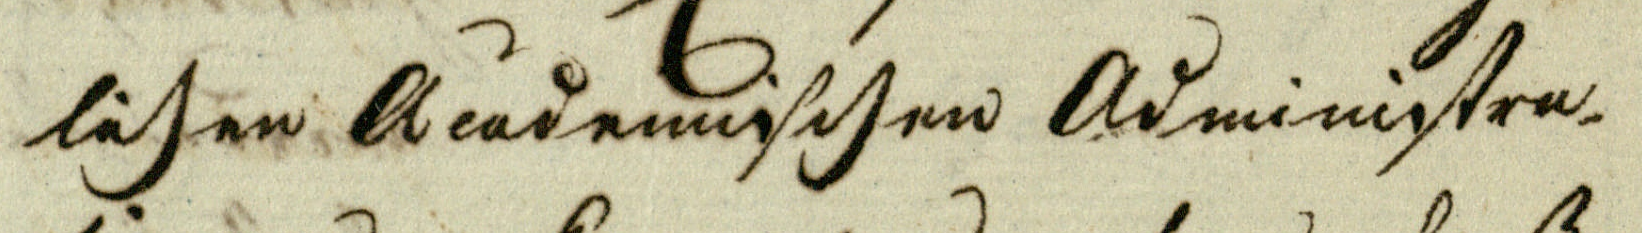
lichen Academischen Admimstra¬
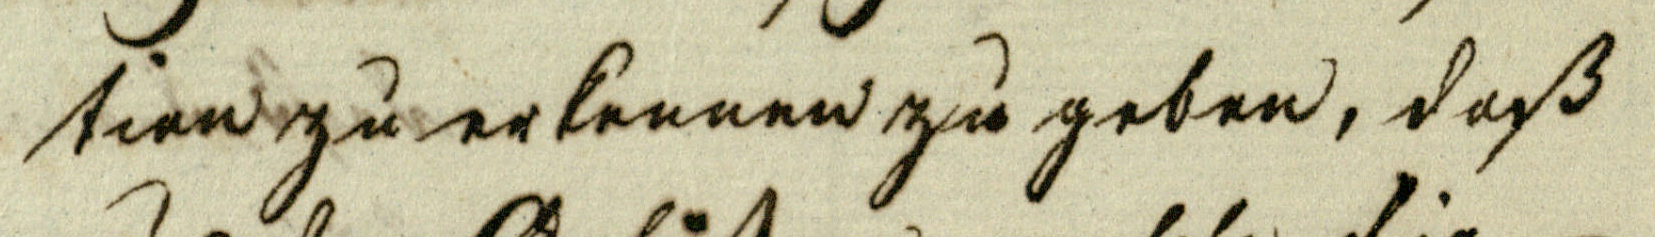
tion zu erkennen zu geben, daß
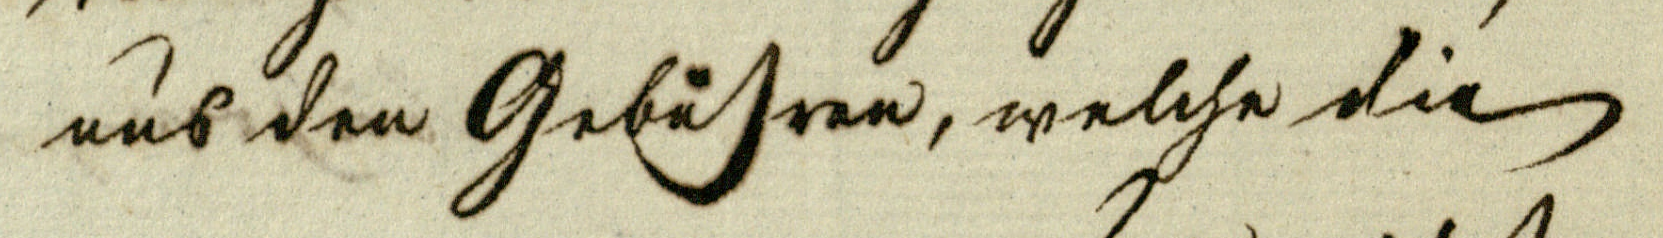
aus den Gebühren, welche die
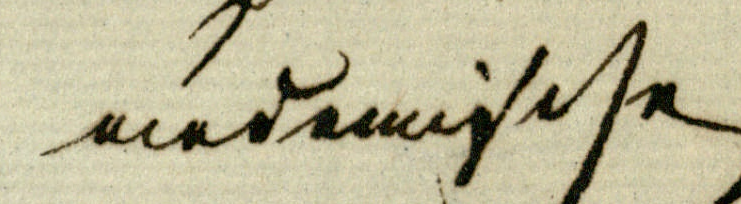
academische
